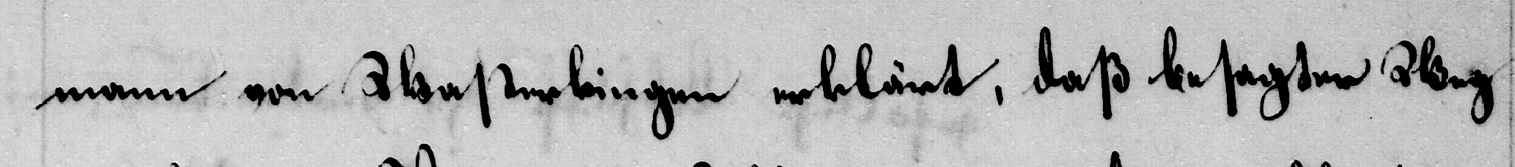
mann von Wasterkingen erklärt, daß besagter Weg
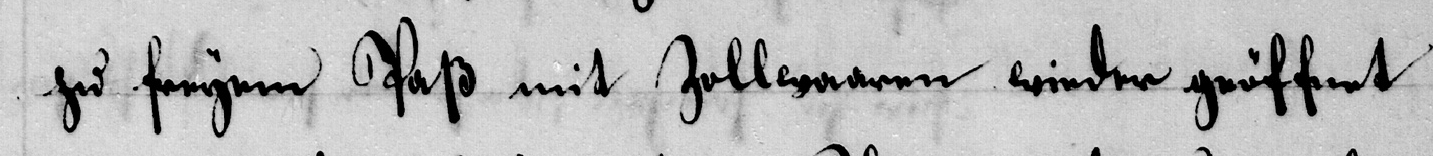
zu freyem Paß mit Zollwaaren wieder geöffnet
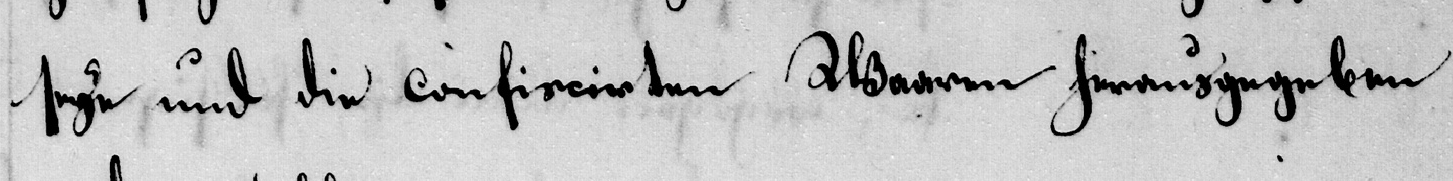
seye und die confiscirten Waaren herausgegeben
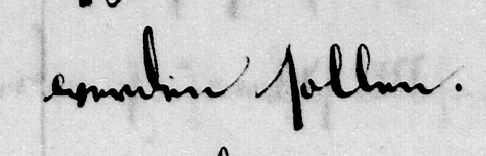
werden sollen.
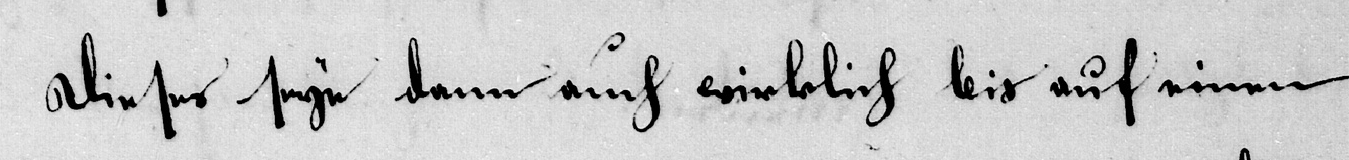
Dieses seye dann auch wirklich bis auf einen
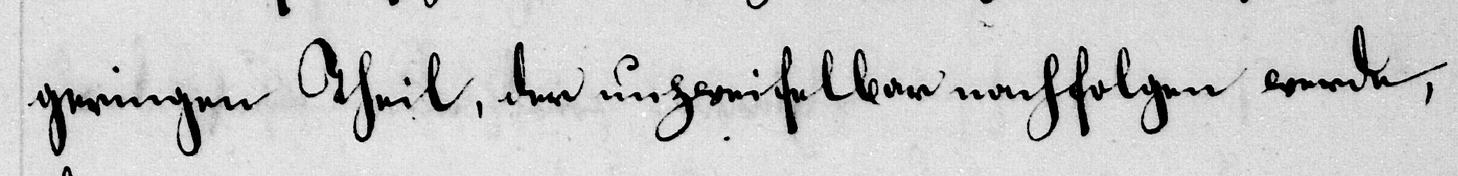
geringen Theil, der unzweifelbar nachfolgen werde,
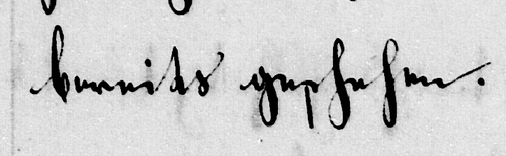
bereits geschehen.
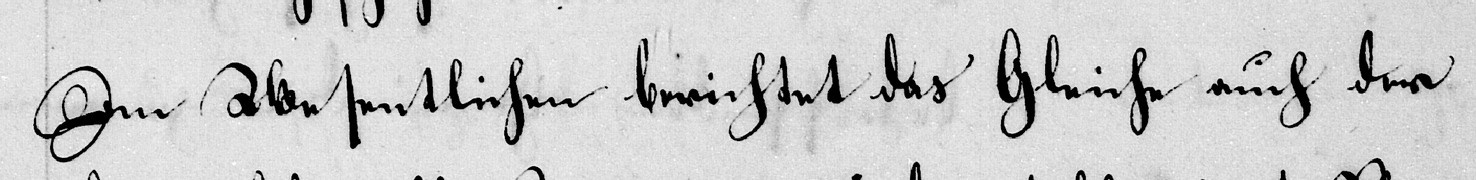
Im Wesentlichen berichtet das Gleiche auch der
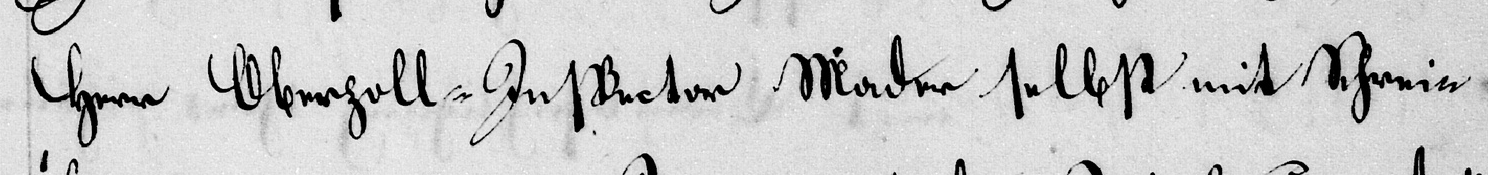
Herr Oberzoll-Inspector Mader selbst mit Schrei¬
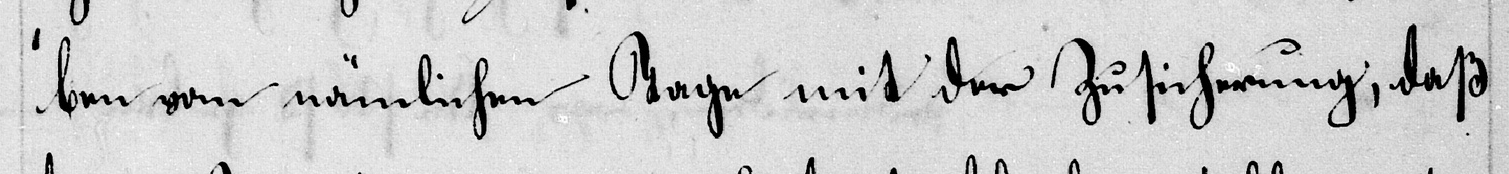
ben vom nämlichen Tage mit der Zusicherung, daß
